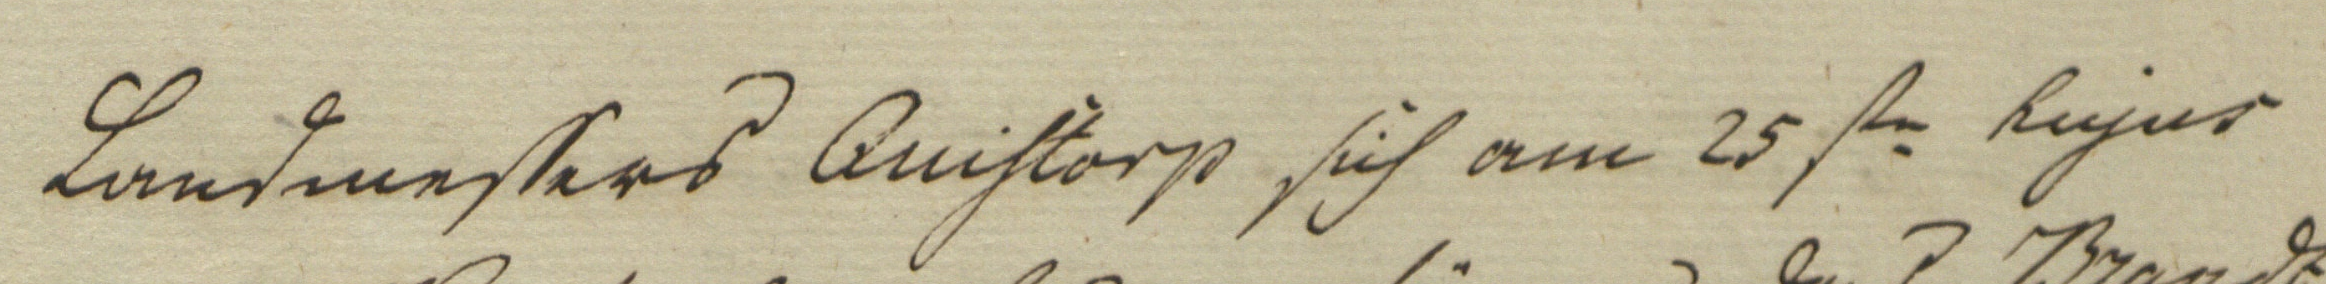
Landmessers Quistorp sich am 25 sten hujus
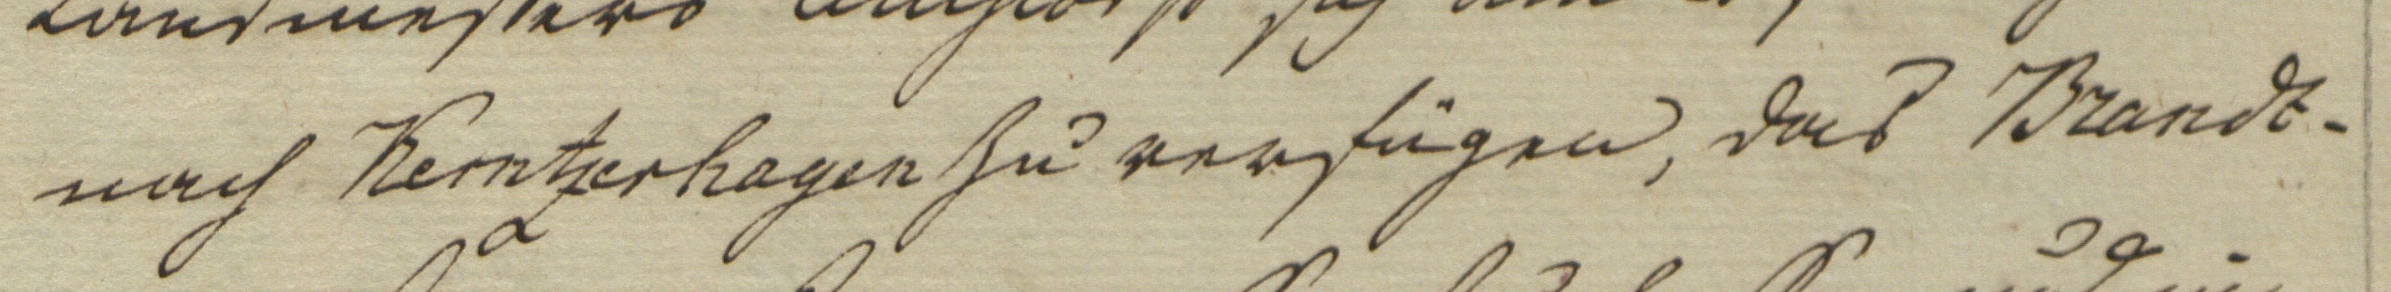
nach Kemtzerhagen zu verfügen, das Brandt¬
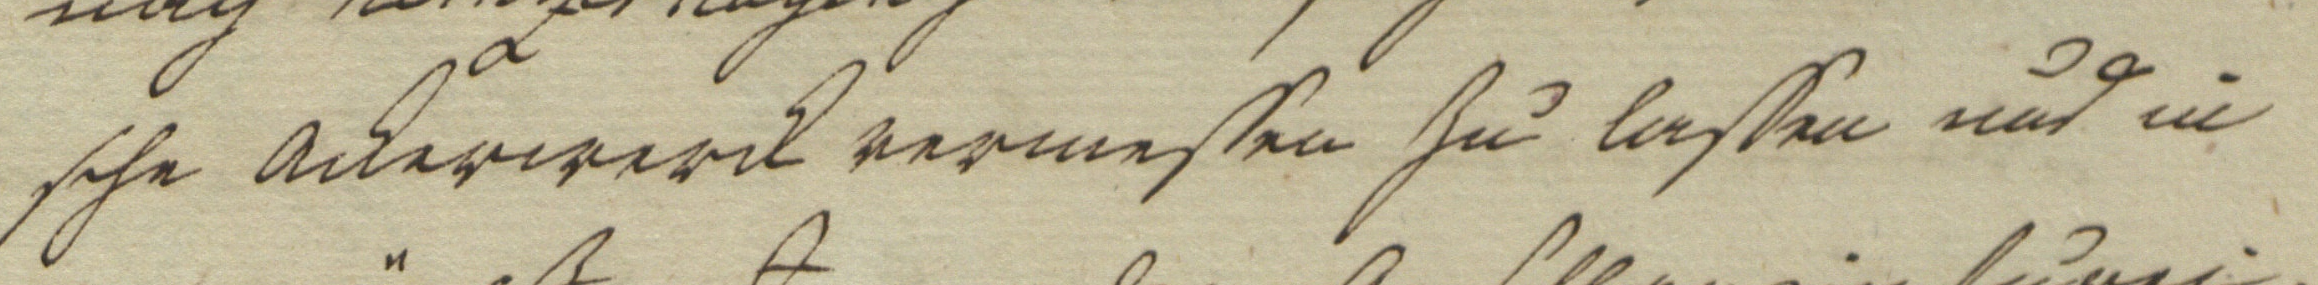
sche Ackerwerck vermessen zu lassen und in
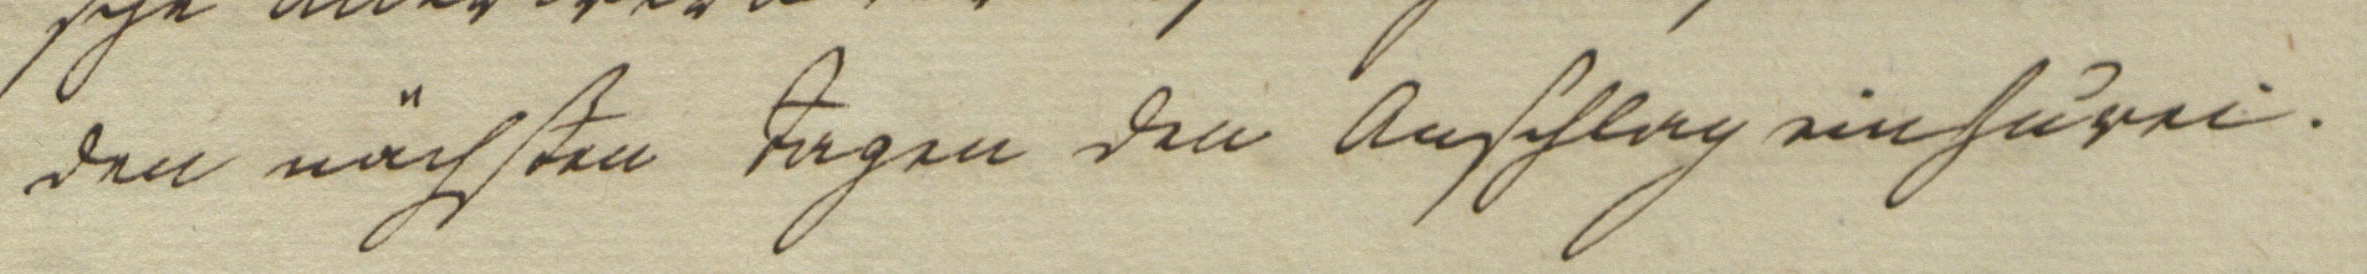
den nächsten Tagen den Anschlag einzurei¬
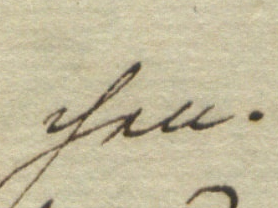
chen.
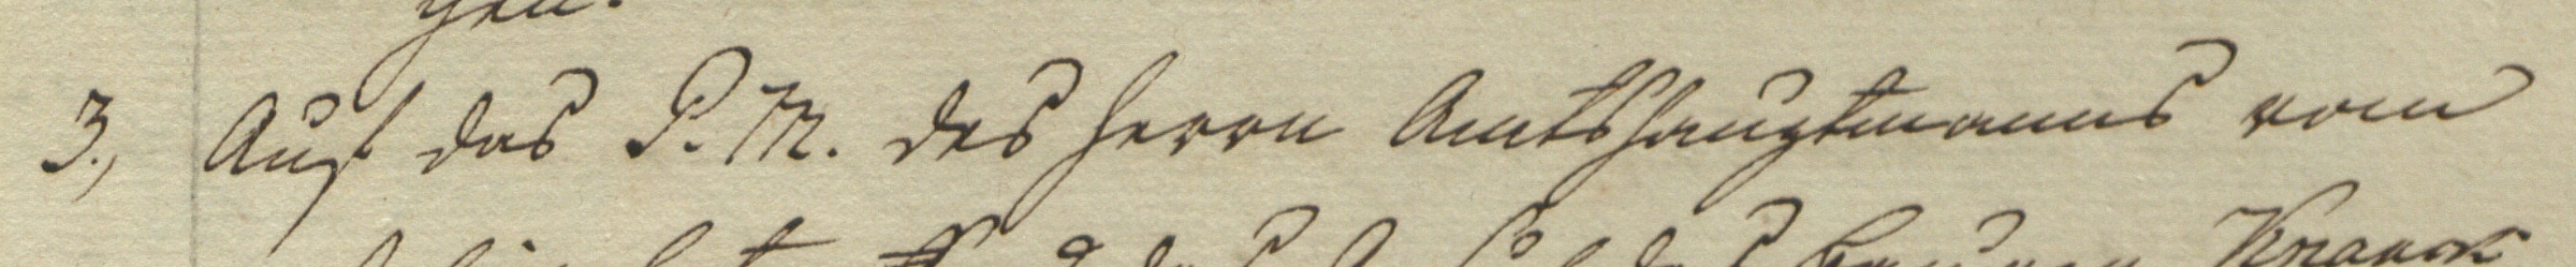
3., Auf das P. M. des Herrn Amtshauptmanns vom
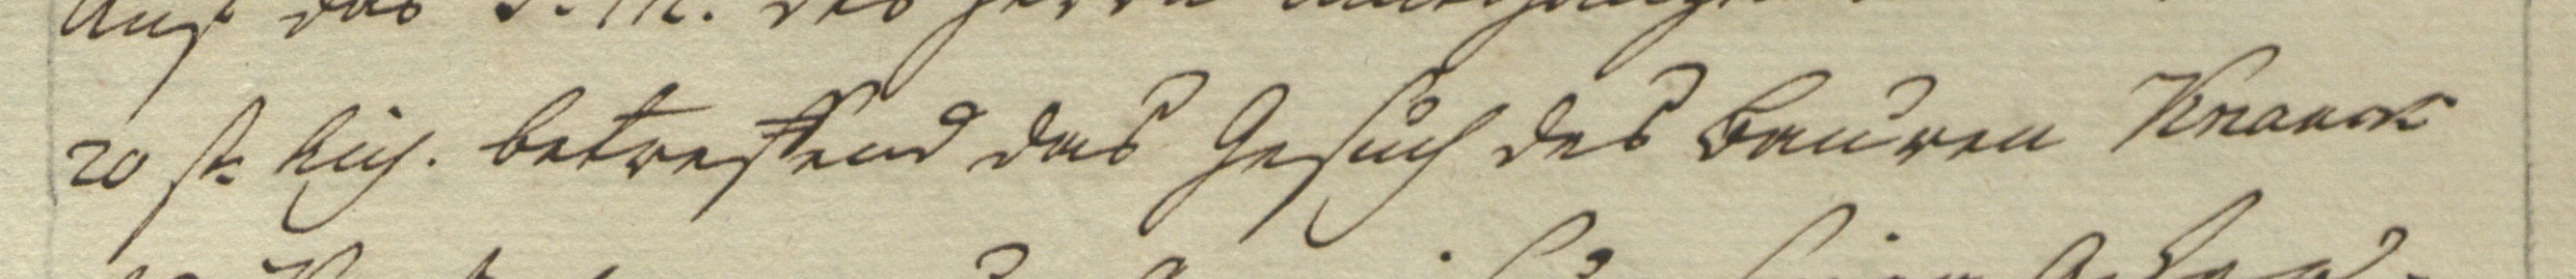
20 st. huj. betreffend das Gesuch des Bauren Knaack
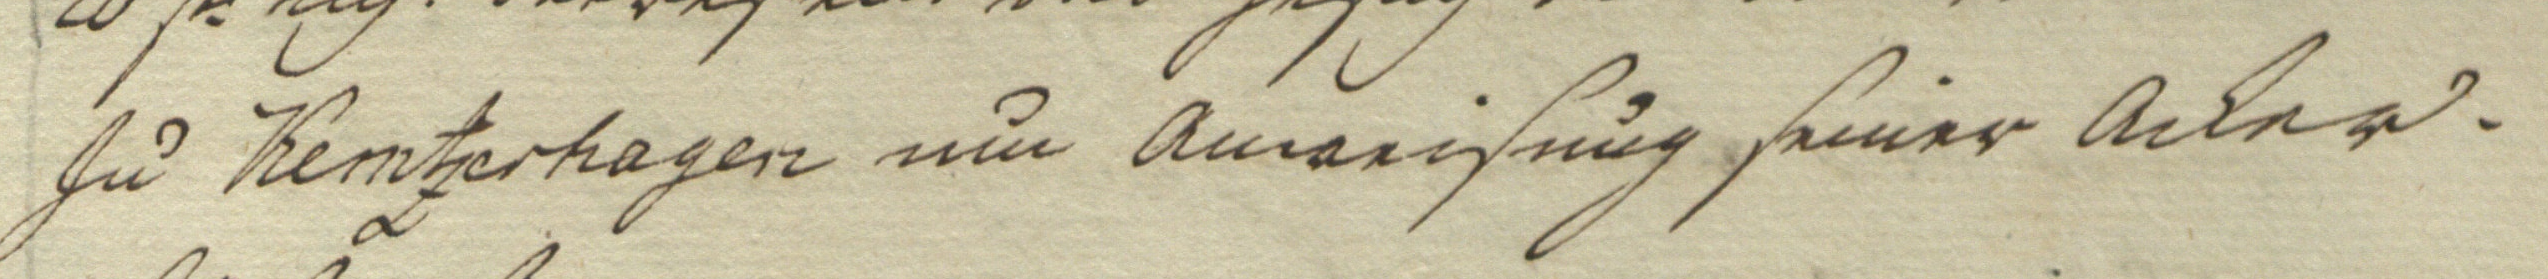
zu Kemtzerhagen um Anweisung seiner Acker¬
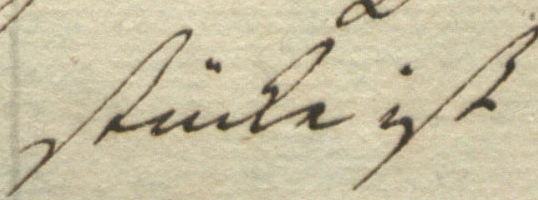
stücke ist
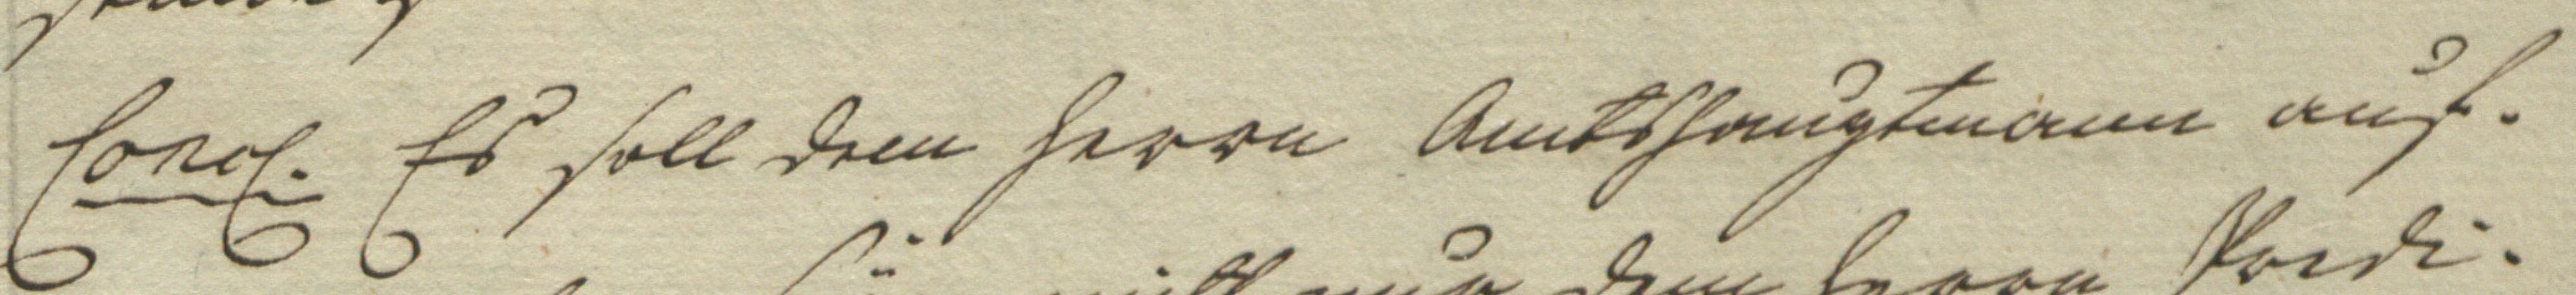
Concl. Es soll dem Herrn Amtshauptmann auf¬
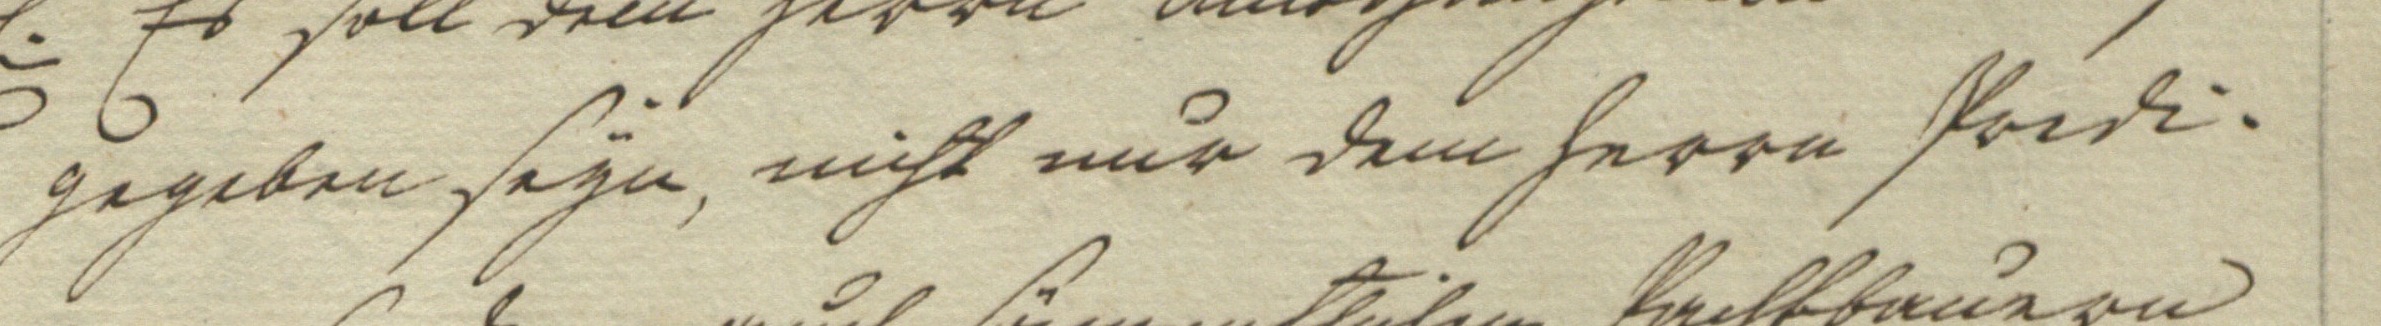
gegeben seÿn, nicht nur dem Herrn Predi¬
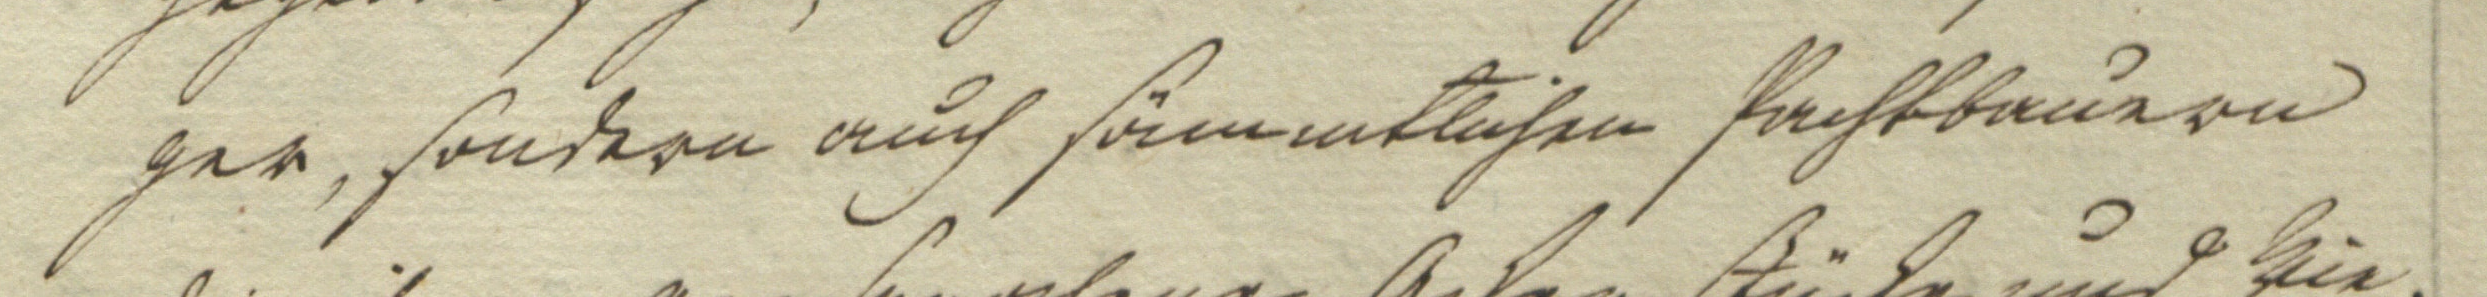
ger, sondern auch sämmtlichen Pachtbauern
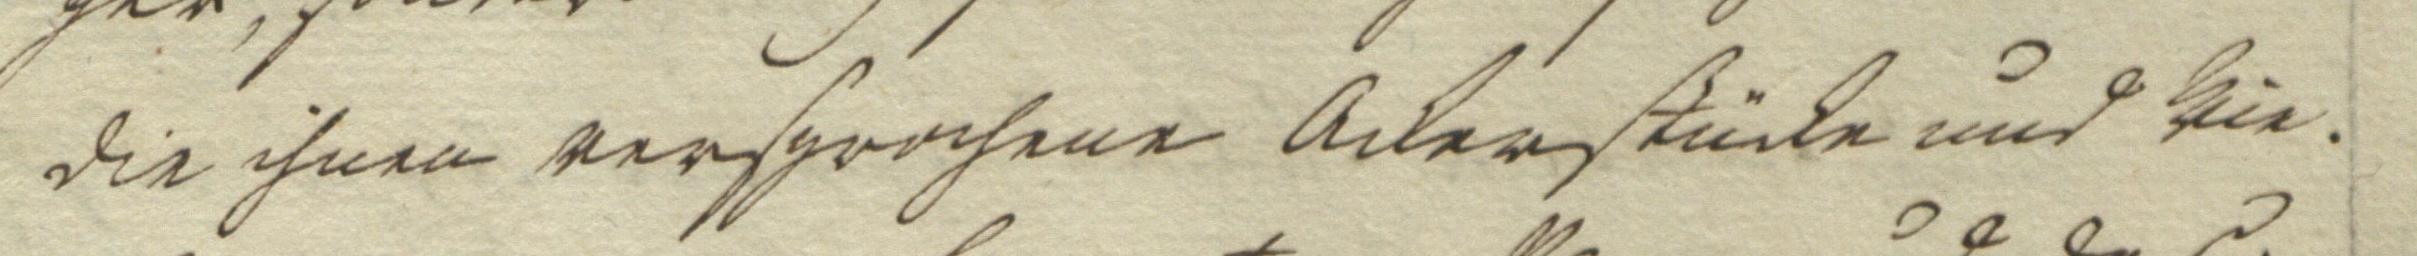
die ihnen versprochene Ackerstücke und Wie¬
